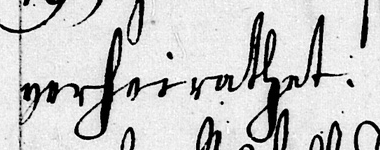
verheirathet.
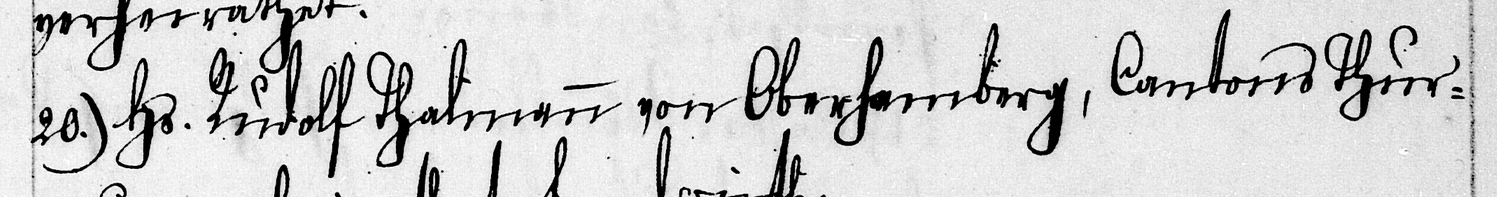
20.) Hs. Rudolf Thalmann von Oberhemberg, Cantons Thur¬
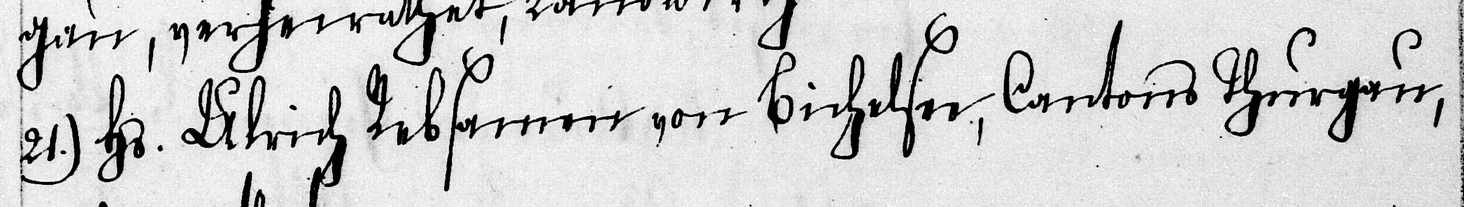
21.) Hs. Ulrich Rebsamen von Bichelsee, Cantons Thurgau,
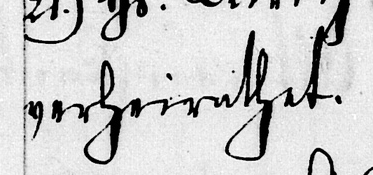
verheirathet.
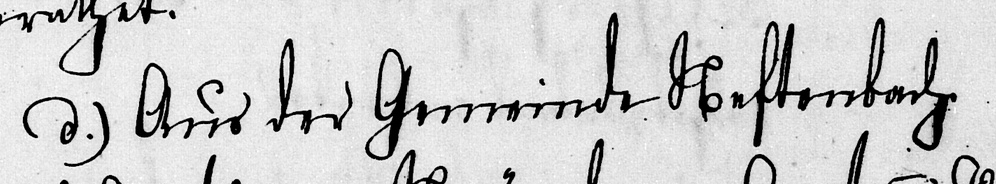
d.) Aus der Gemeinde Neftenbach.
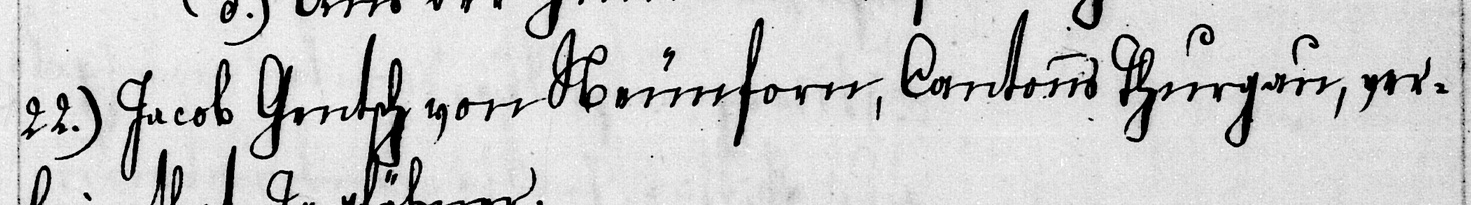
22.) Jacob Gentsch von Neunforn, Cantons Thurgau, ver¬
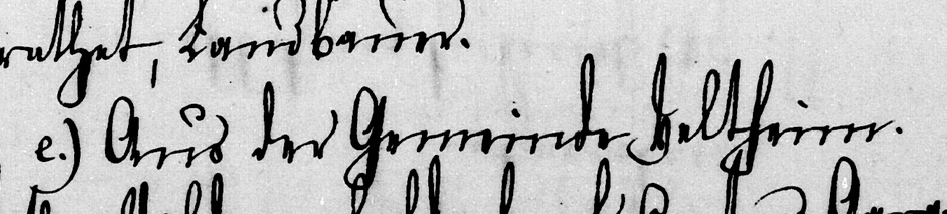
e.) Aus der Gemeinde Veltheim.
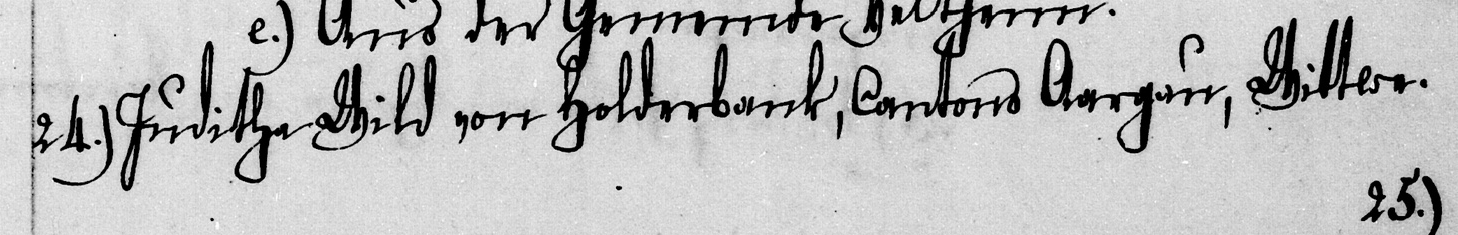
24.) Juditha Wild von Holderbank, Cantons Aargau, Wittwe.
